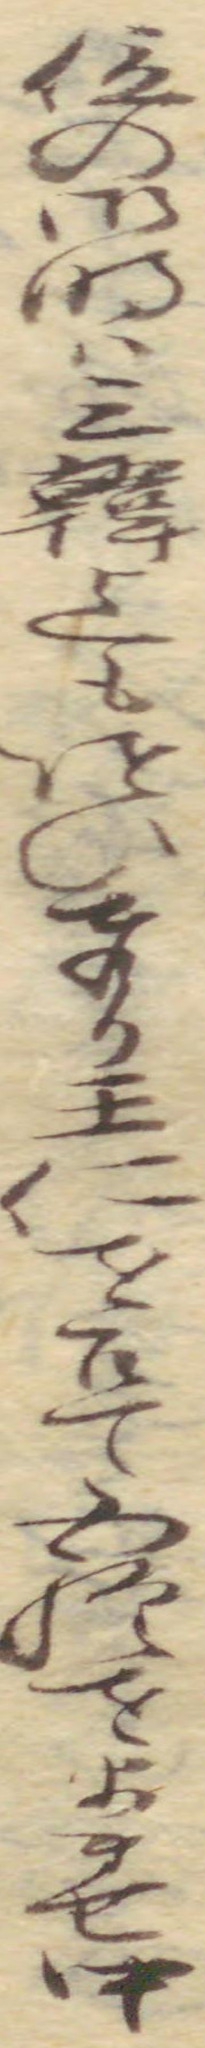位の御時は三韓迄も随ひ奉り王仁を召て五経をよませ中
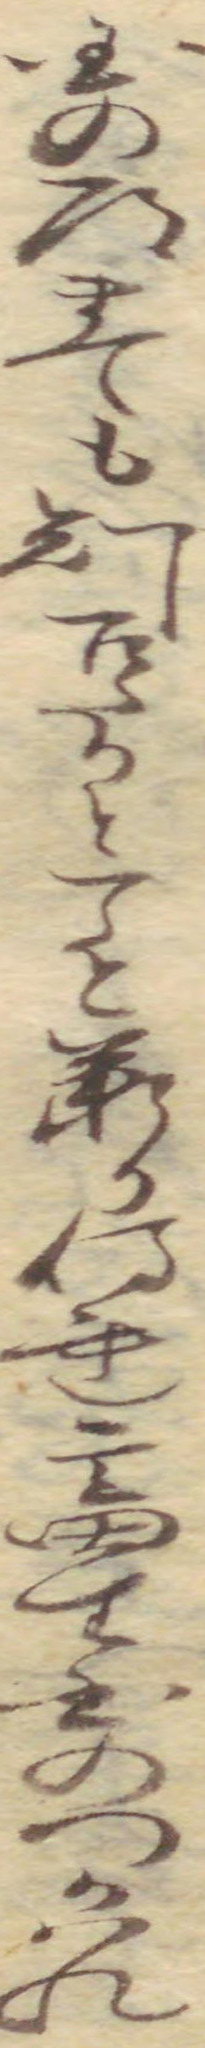国の道まても知し召たりとこそ承り侍れ畜生国のつかはれ
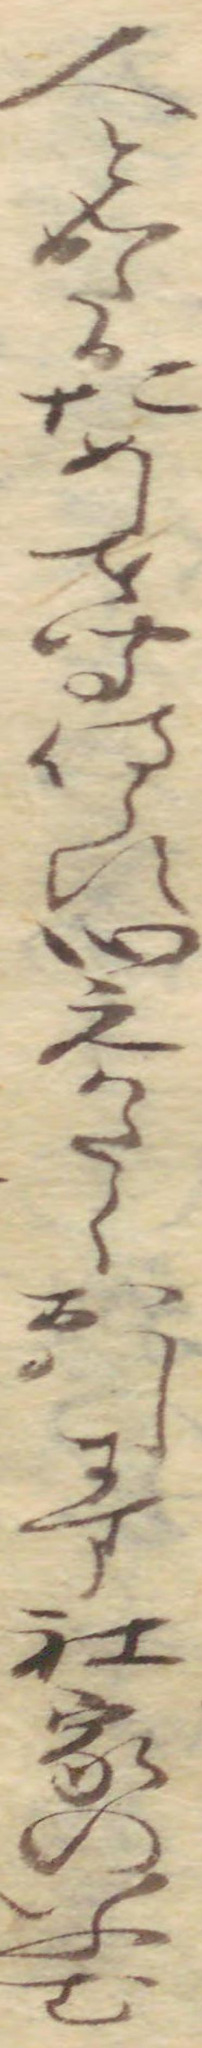人と成たるためしを聞侍らす心えかたくおはします社家のいふむ
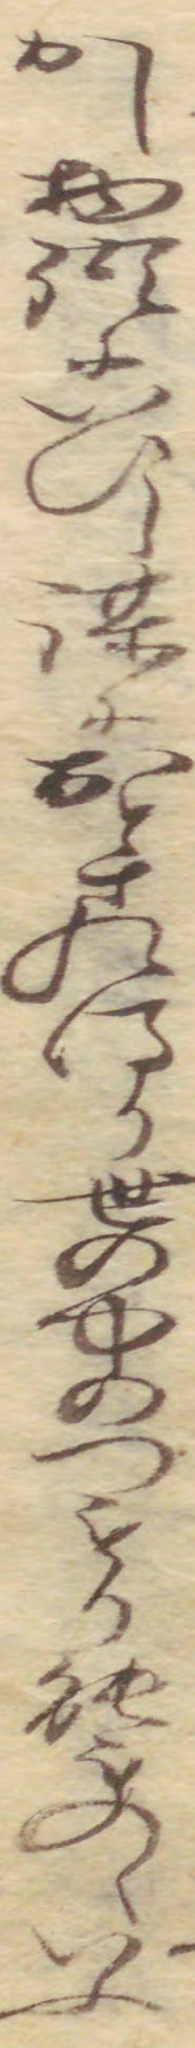かし物語にいひし謀におとされ侍り世の中のつもり能ものゝいふ
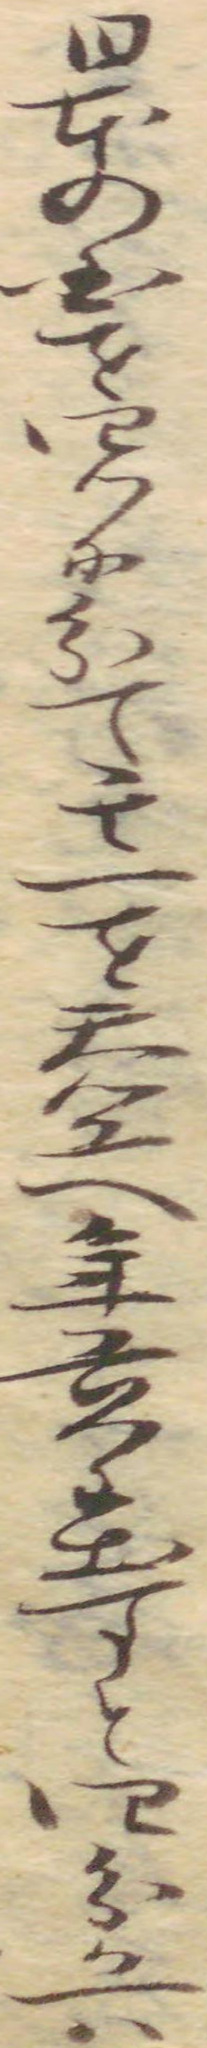日本の国を四ツに分て其一を天竺へ年貢に出すと四分か一は
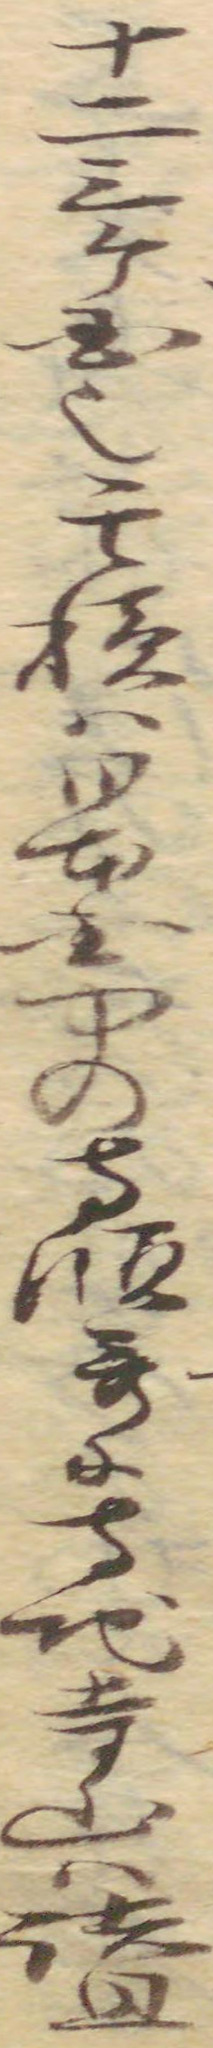十二三ヶ国也其積は日本国中の寺領并に寺地寺山は諸旦
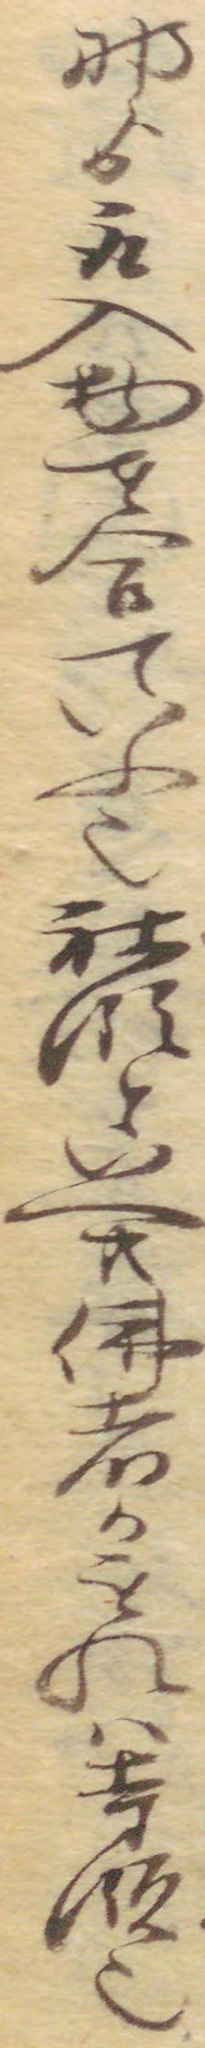那ゟ取入物を合ていふ也社領といへ共仏者かもれは寺領也

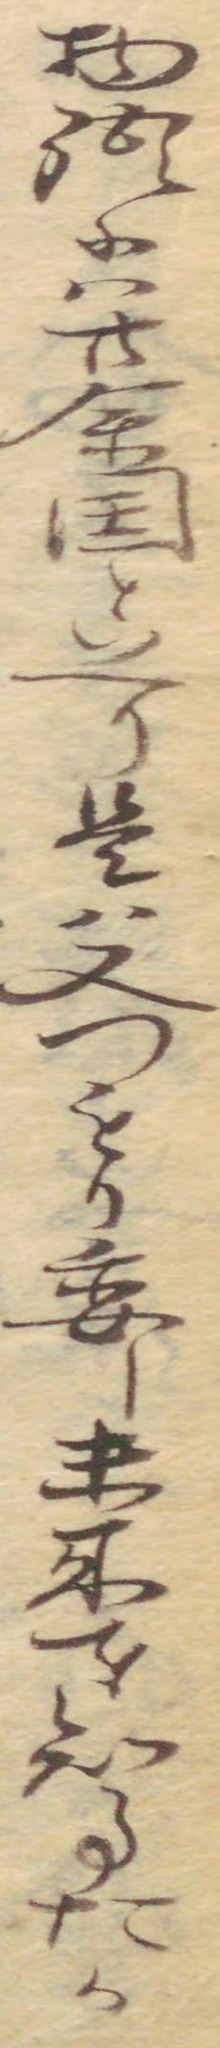物語には廿余国といへり是は又つもり委し未来を知事たか
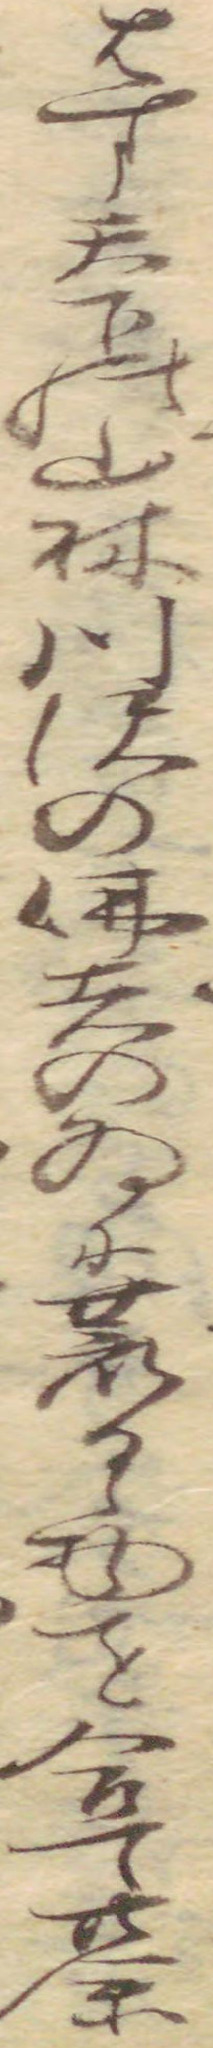はす天下の山林川沢の仏者の為に荒るゝ物を合て廿余
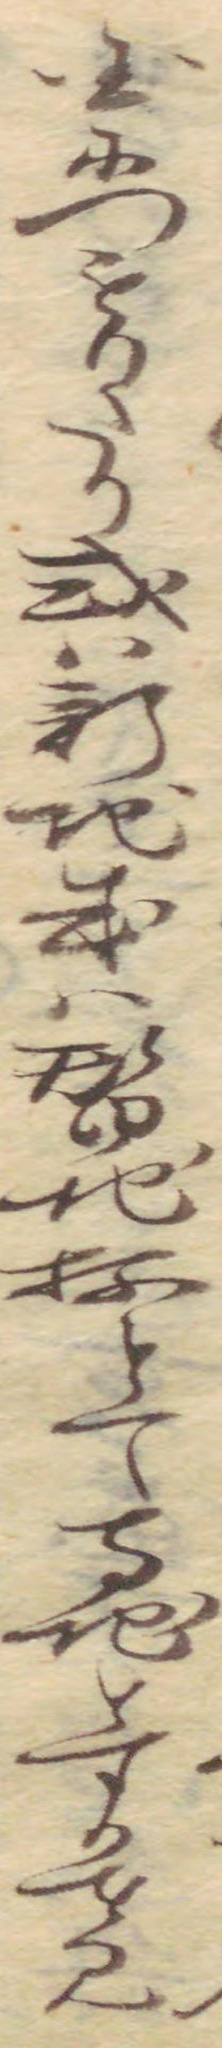国につもりたり或は新地或は替地抔とて寺地とするを見
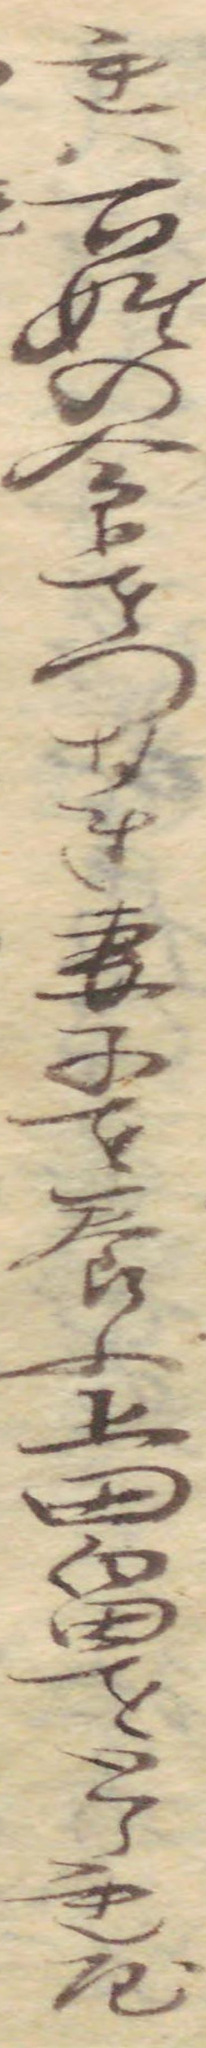れは百姓の命をつなき妻子を養ふ上田畠をとられ屋
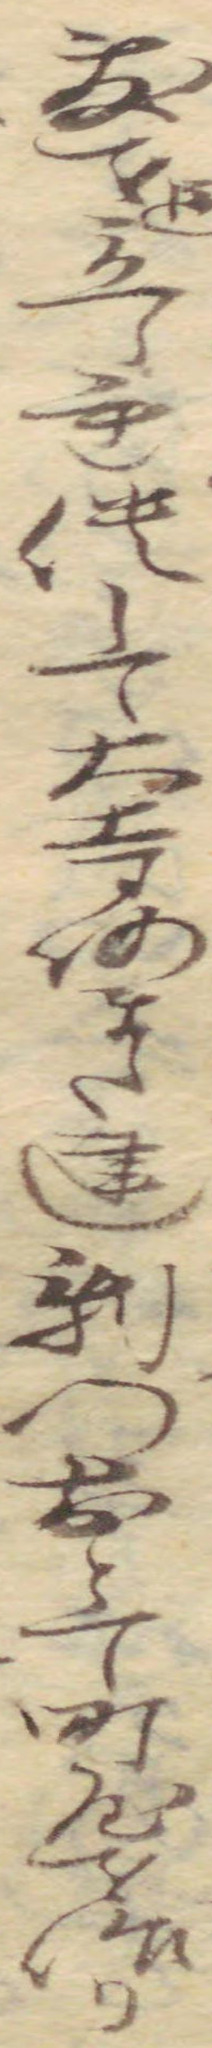敷を追立られ潰して大寺あまた建剰門前とて町家を作り
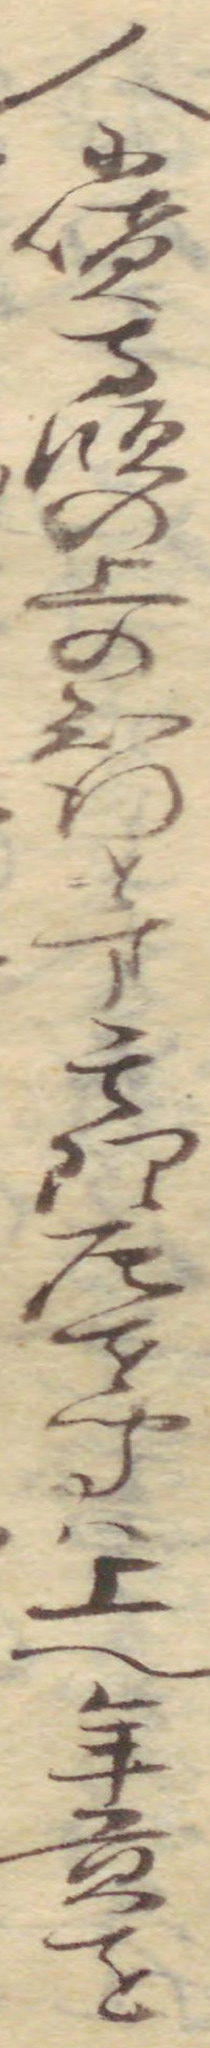人に貸寺領の上の知行とす其理屈を聞は上へ年貢を
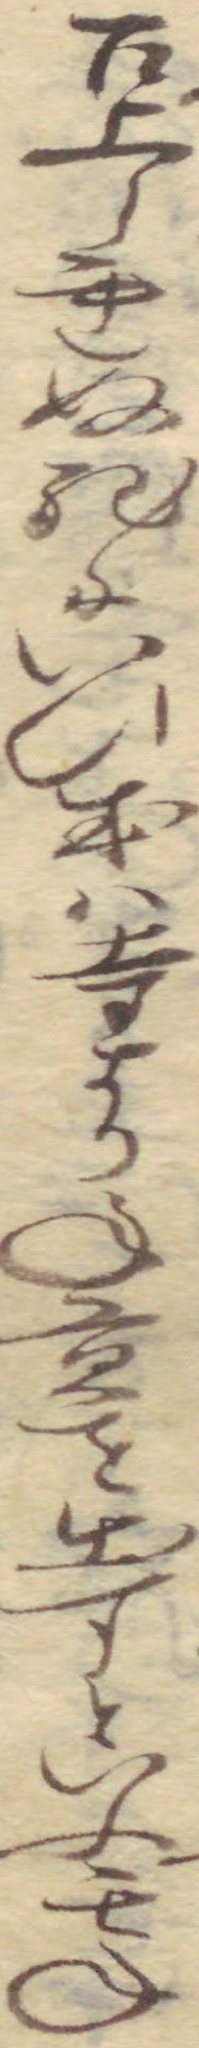召上られぬ程にいひ或は寺より年貢を出すといふ其年
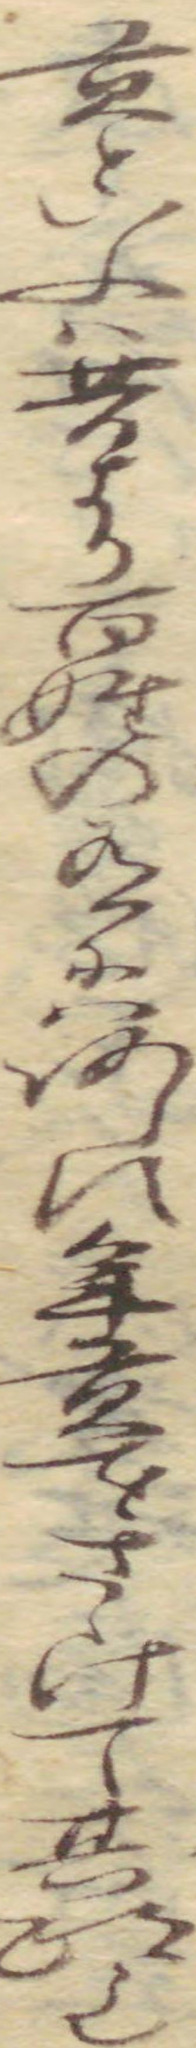貢といふは昔より百姓の有にはあらす年貢をさゝけて其跡にて
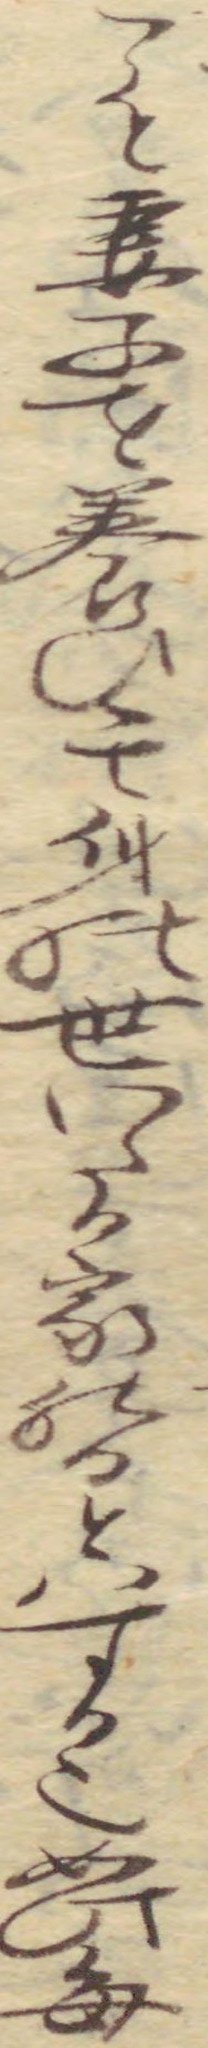こそ妻子を養ひ其身の世はたる家督とはする也如此毎
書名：鶯宿雑記. 巻263-264
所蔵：国立国会図書館 National Diet Library, JAPAN
